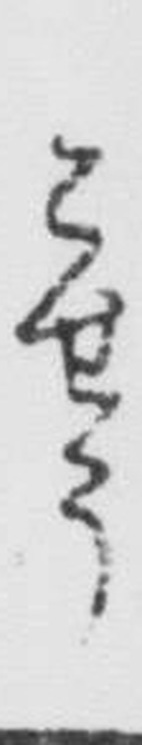こせう
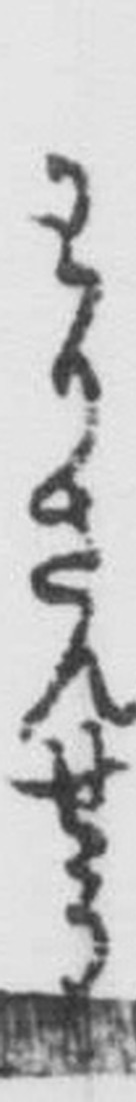きりさんせう
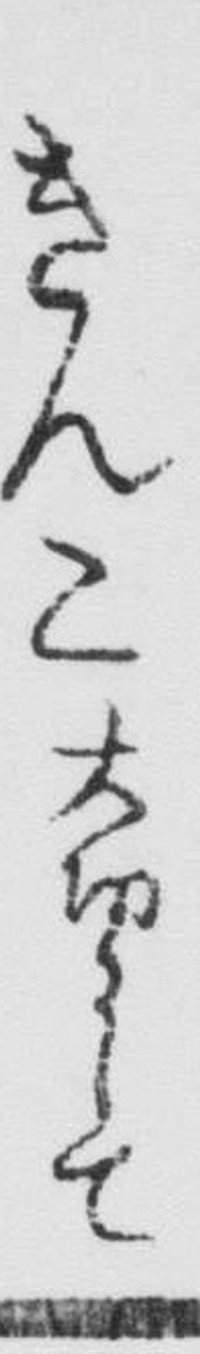きんこ大切にして
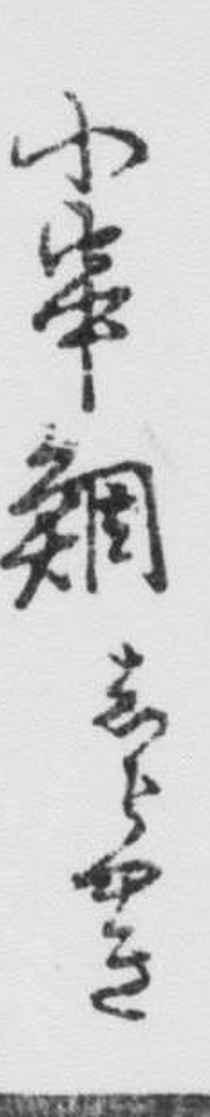小串鯛しらやき
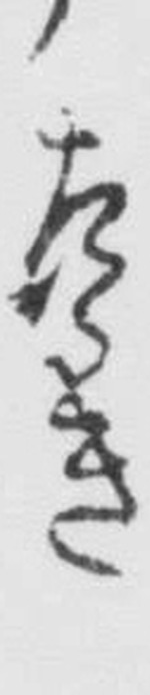すゝき
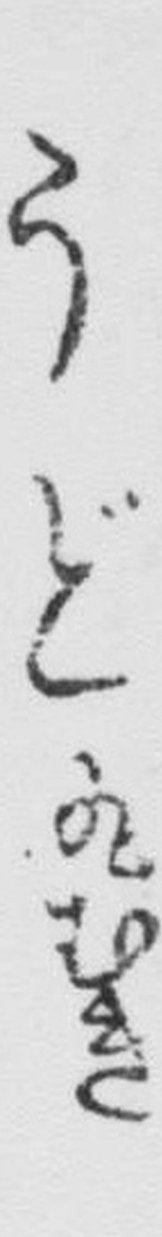うど丸むき
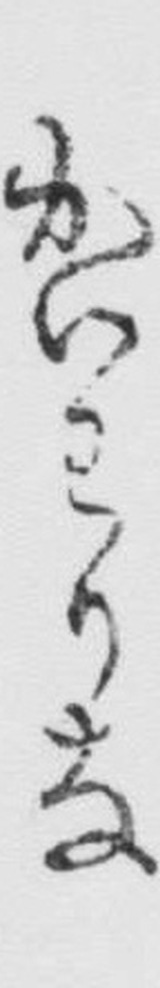かいわりな
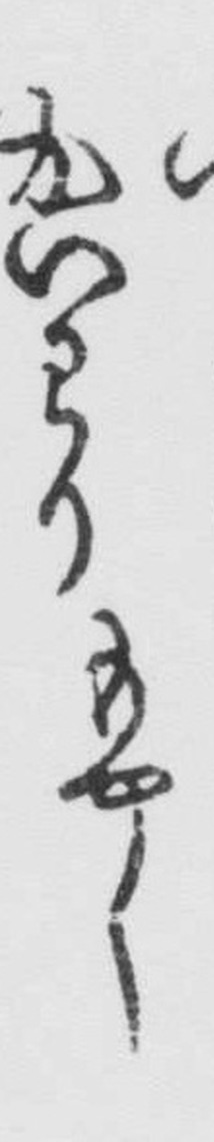かいわりもやし
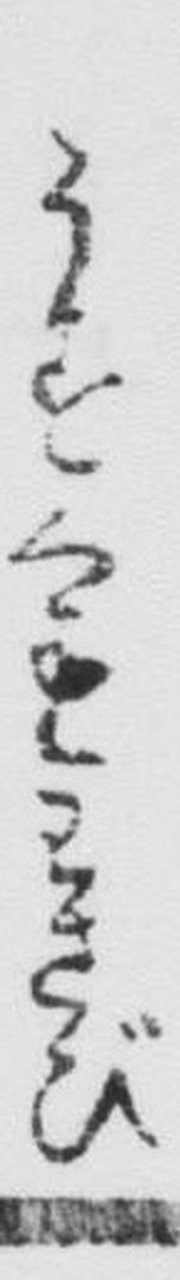うすくすわさび
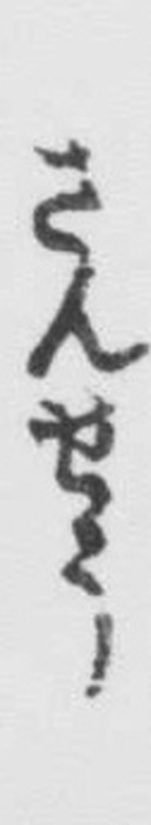さんせう
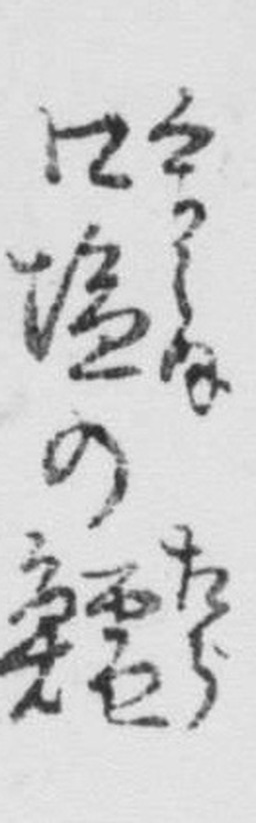口塩の鱈
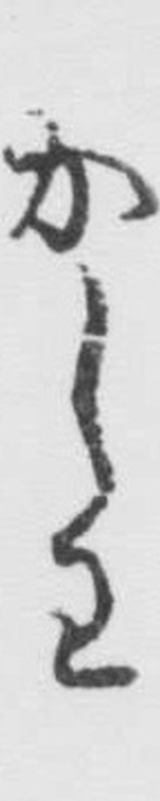かしわ
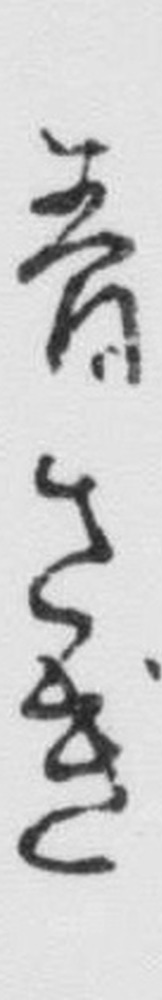青さき
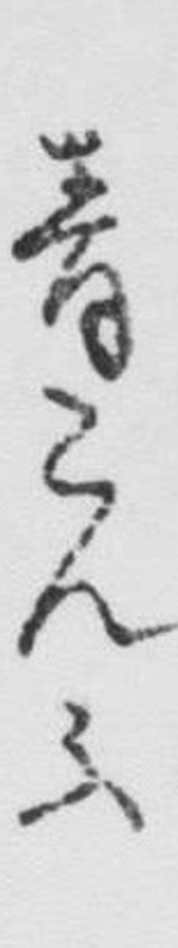青こんふ
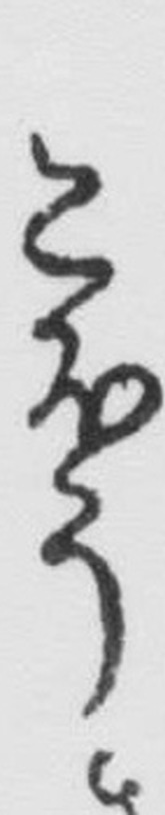こせう
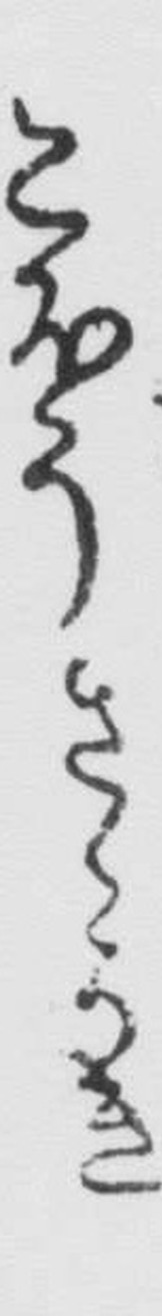こほうさゝがき
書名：諸家通用/即席料理
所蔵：大阪府立大学学術情報センター 国文学研究資料館
